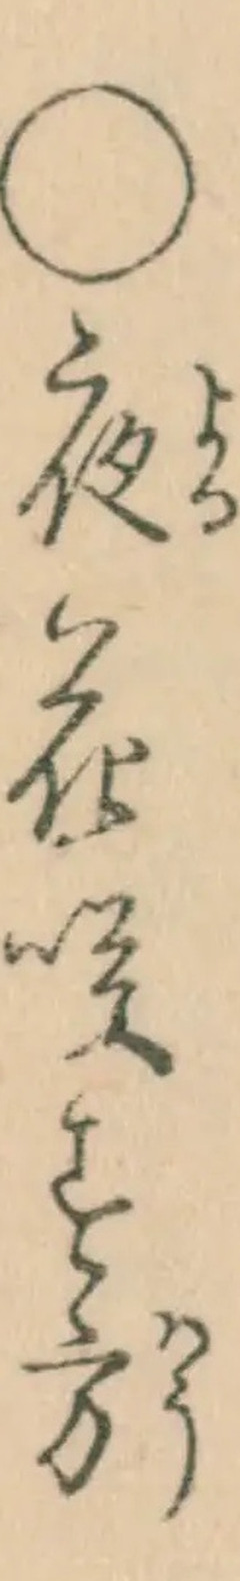〇夜花咲す方
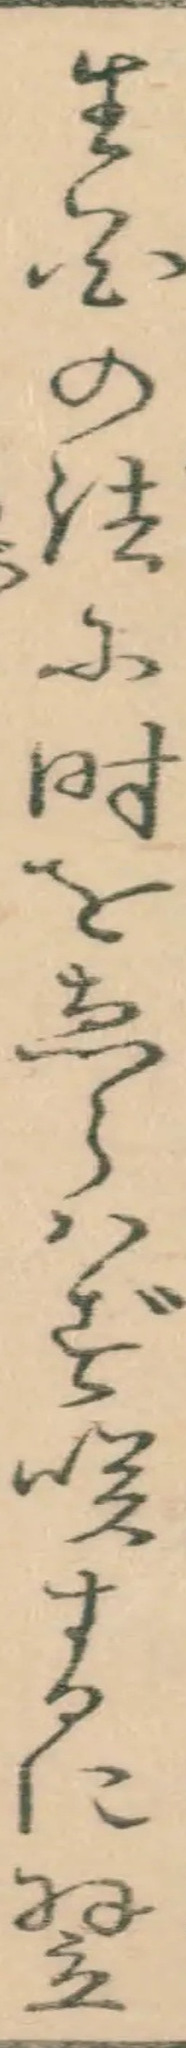生花の法に時をゑらハず咲するに翌
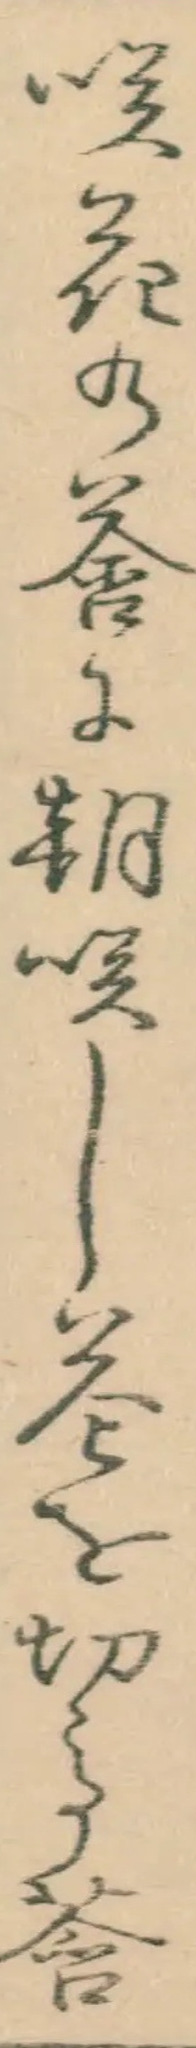咲花の莟に朝咲し莟を切て莟
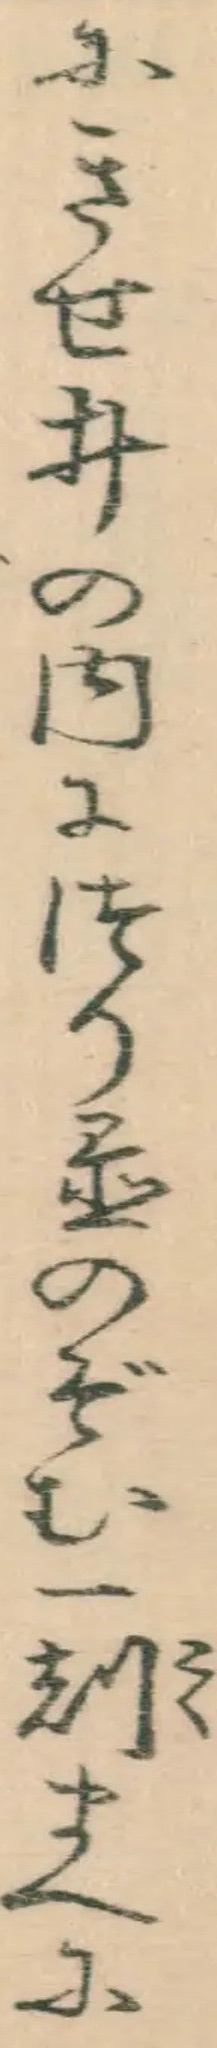にきせ井の内につり置のぞむ一刻まへに
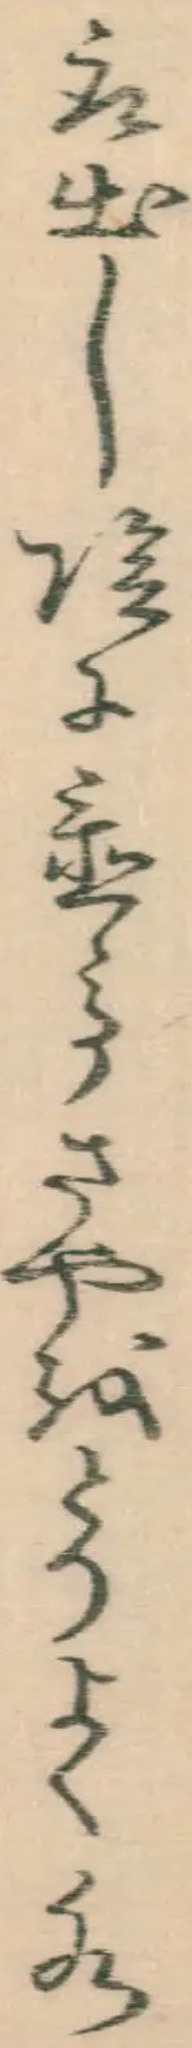取出し陰に置てさやをとりよく水
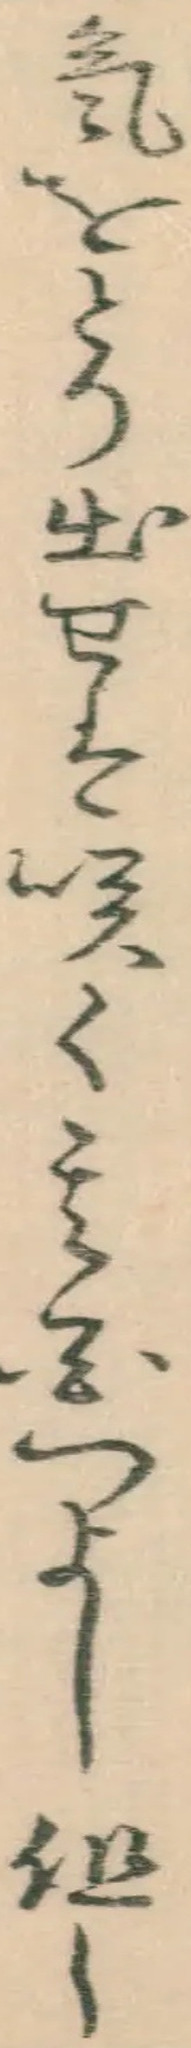気をとり出せは咲く其花つよし但し
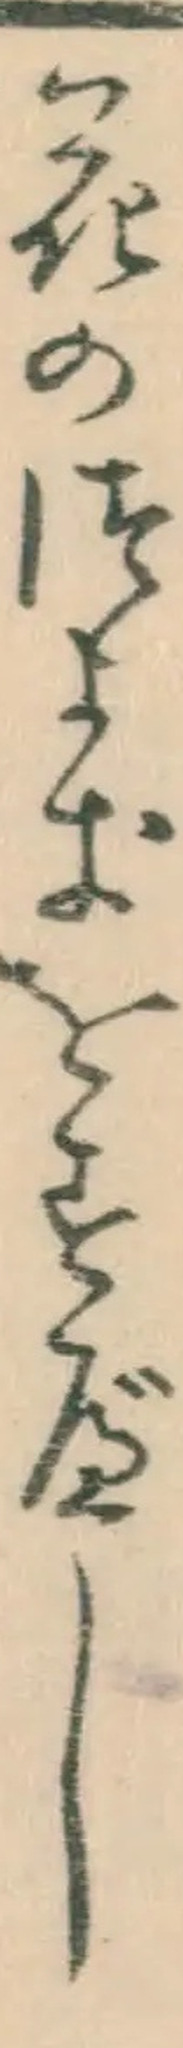花のつよきをすべし
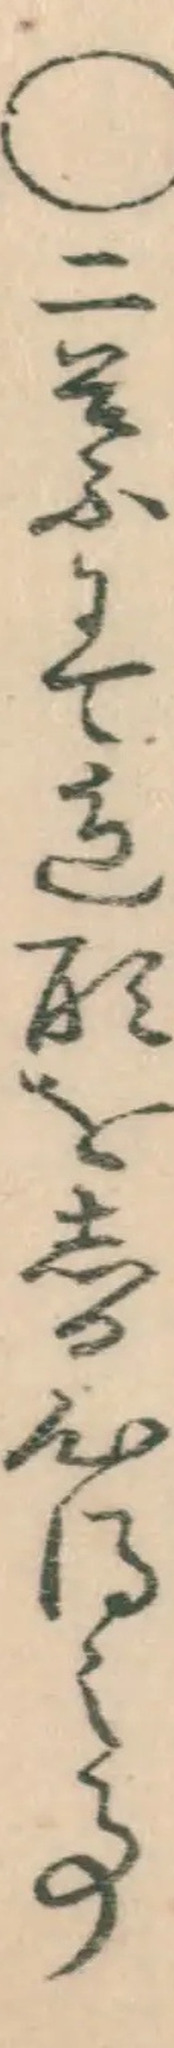〇二葉にて色形をしる心得之事
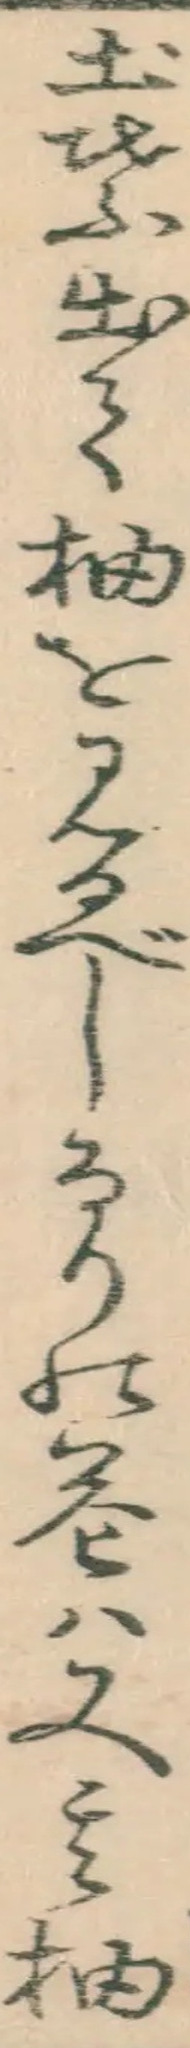土葉出て柚を見るべしるりの莟ハ又其柚
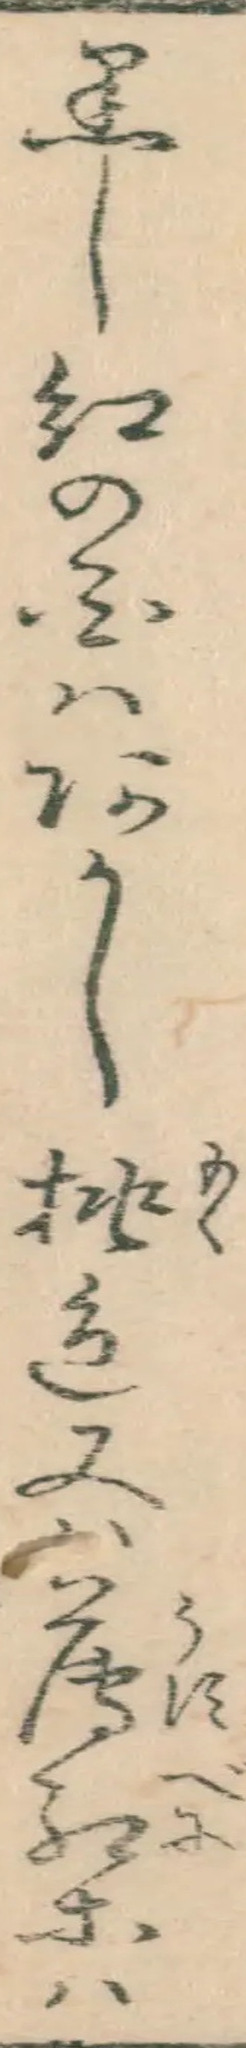黒し紅の花ハあかし桃色又ハ薄紅等ハ
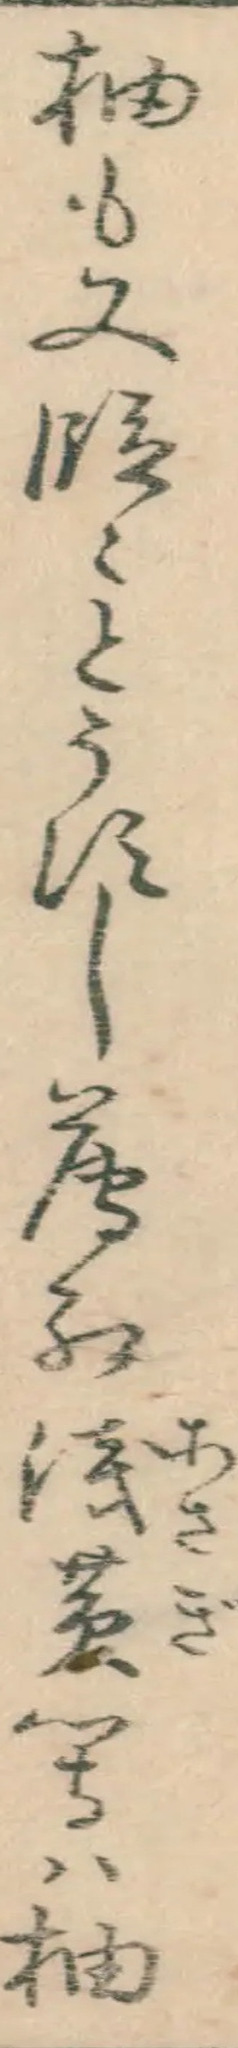柚も又段々とうすし薄紅浅黄等ハ柚

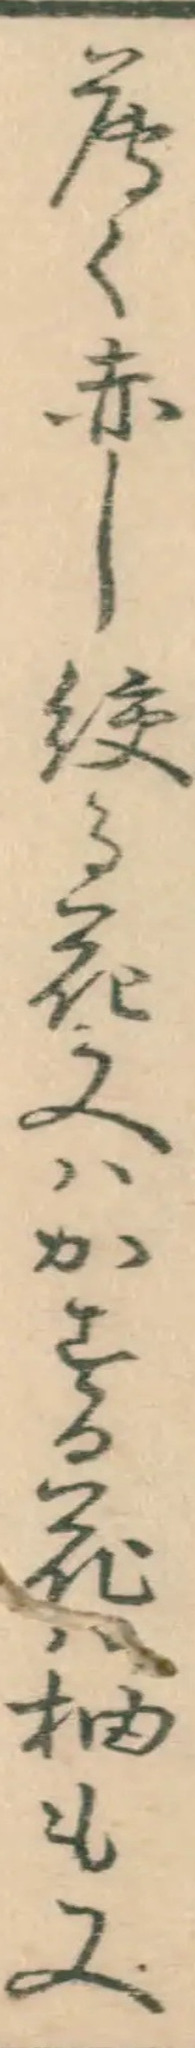薄く赤し絞る花又ハかする花ハ柚も又
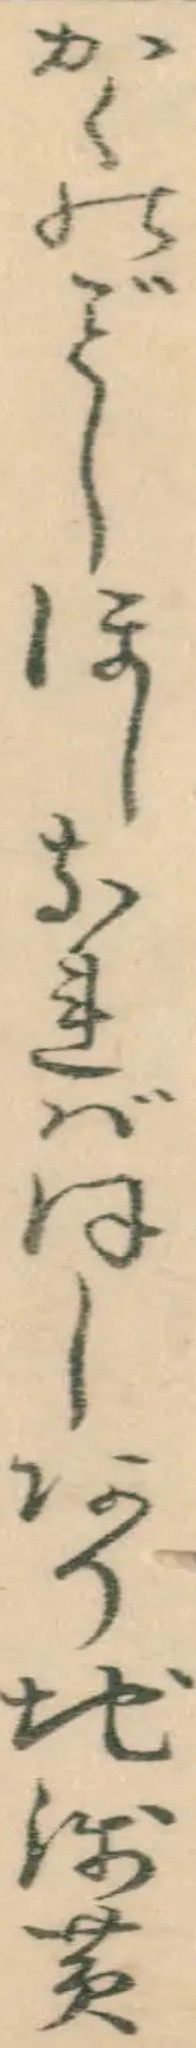かくのごとしほしなれバほしなり地浅黄
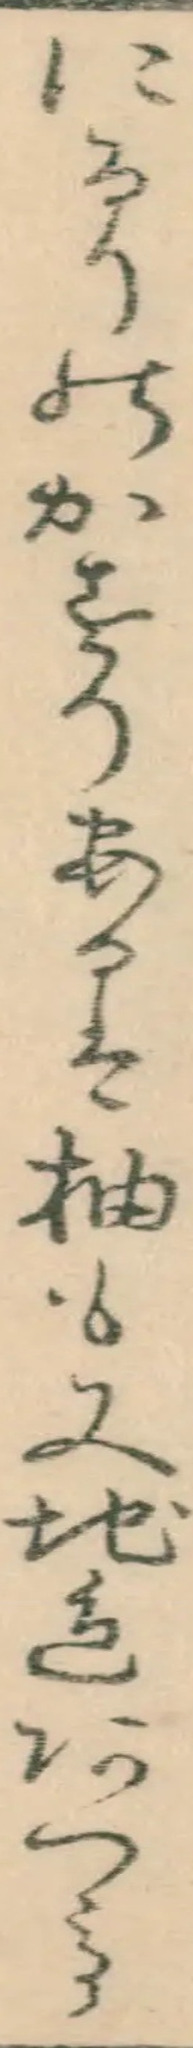にるりのかすりあるは柚も又地色あつて
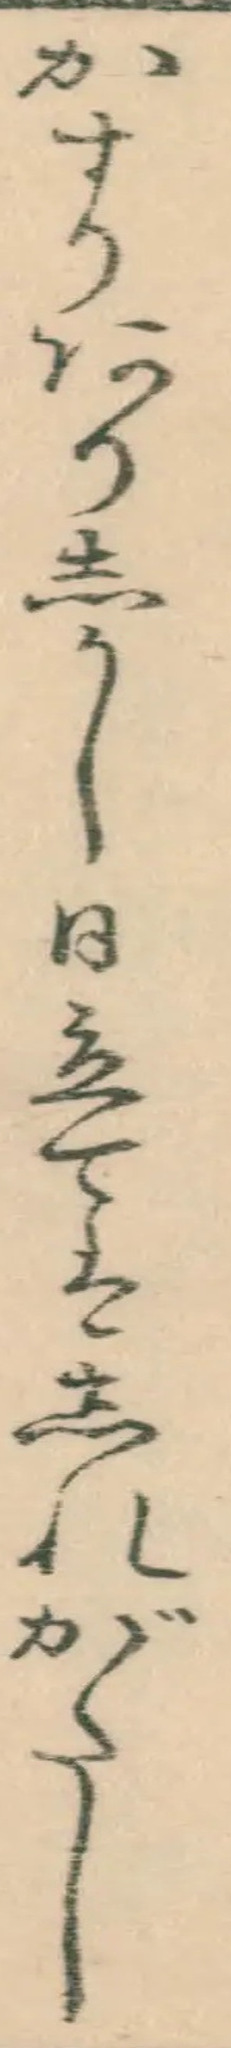かすりありしかし日立てはしれがたし
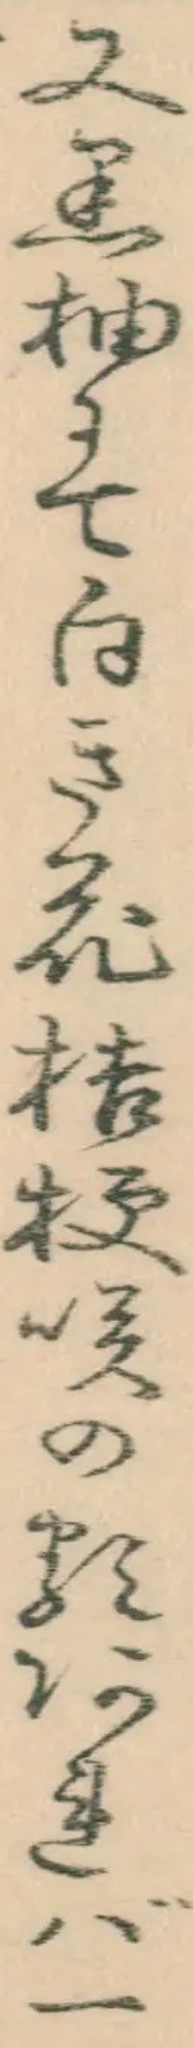又黒柚にて白き花桔梗咲の類あれバ一
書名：花壇朝顔通 2巻. [2]
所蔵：国立国会図書館 National Diet Library, JAPAN
